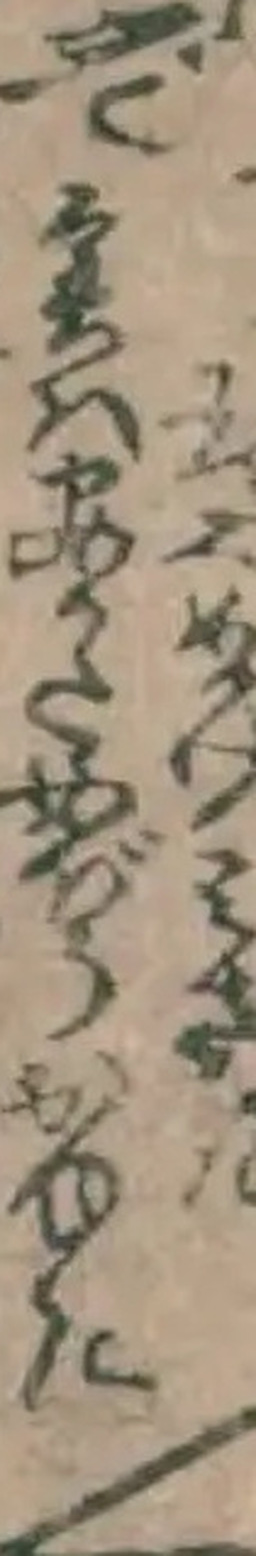実はあかた女ぼうおゆき
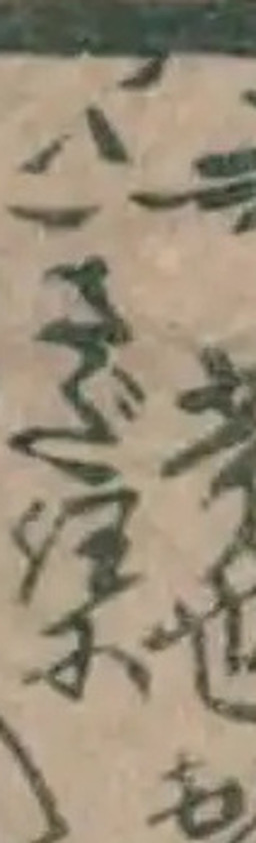さだ任に
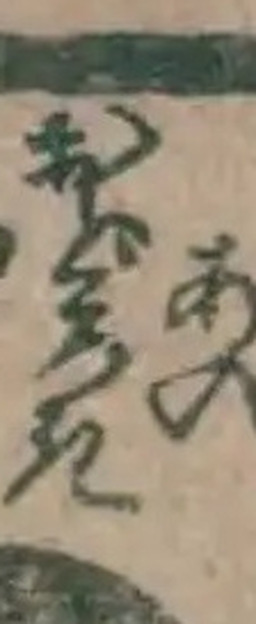おどろき
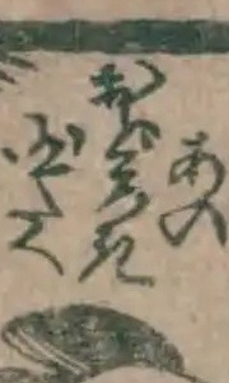おどろき
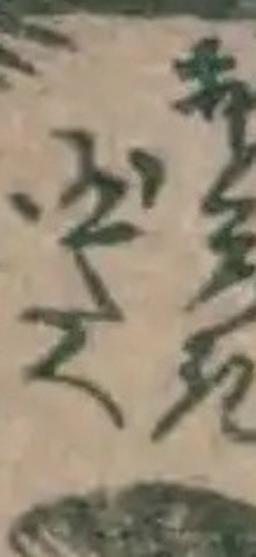国たへ
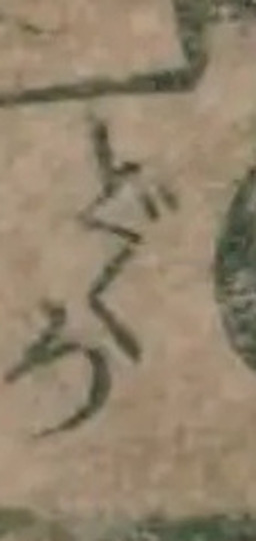どくろ
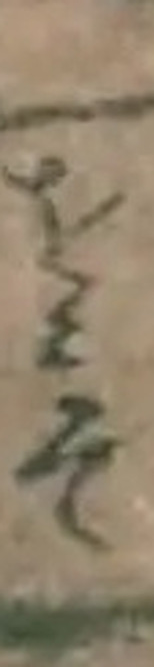をみて
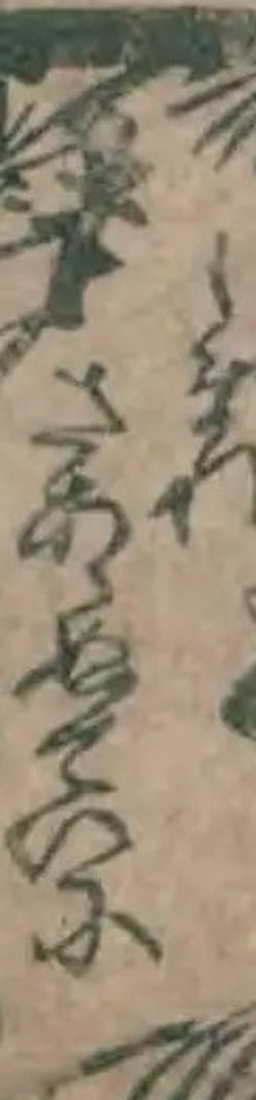さあらぬていに
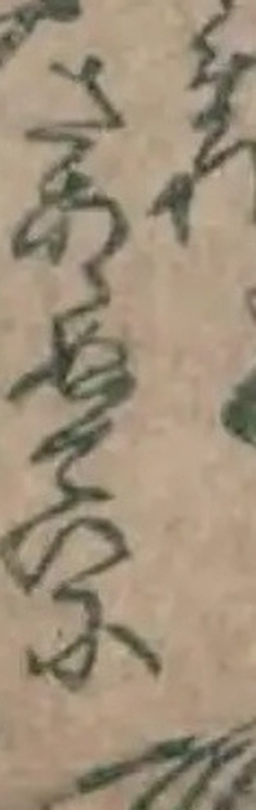さあらぬていに
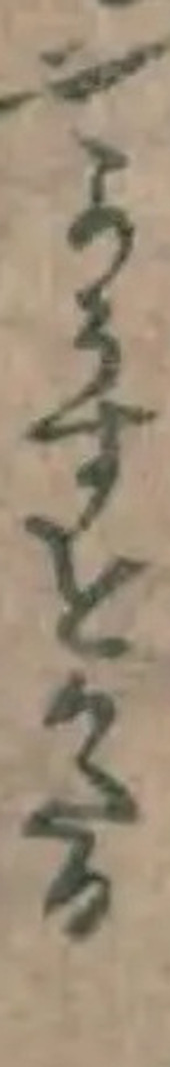ようすをかたる

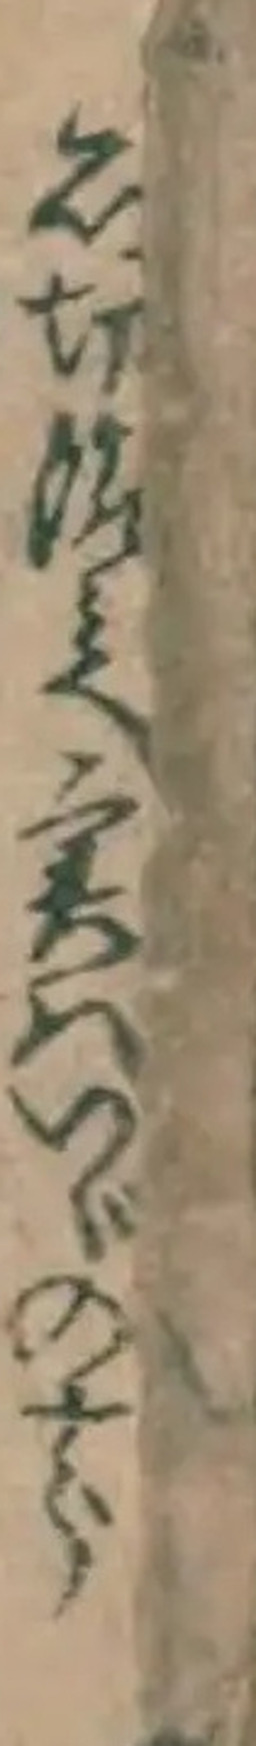石切清兵衛実はいぐの十郎
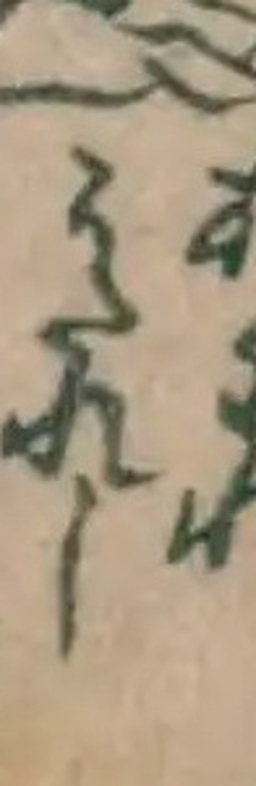うたれし
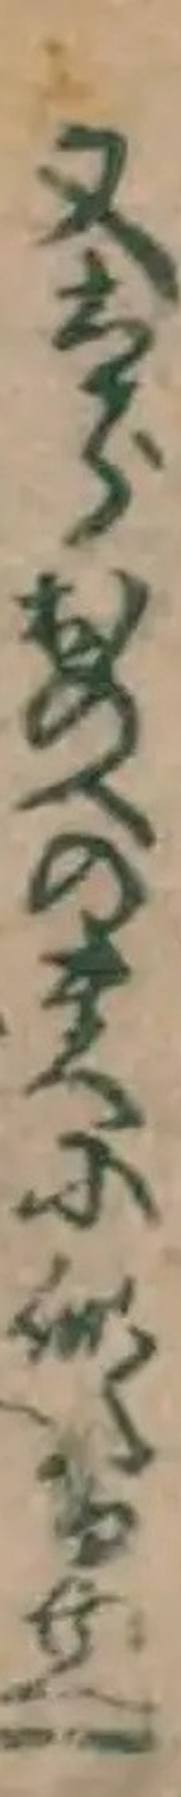又太郎おのへのまへ似たるゆへ
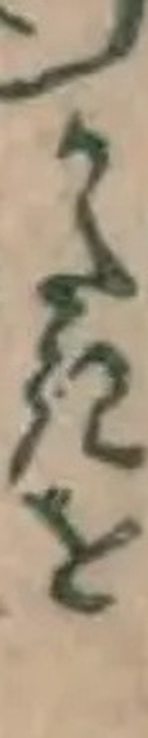かたきを
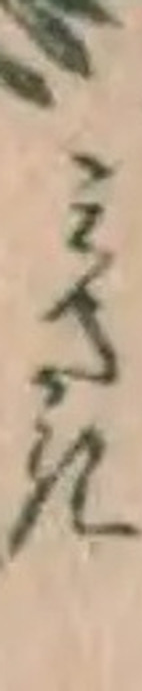みさき
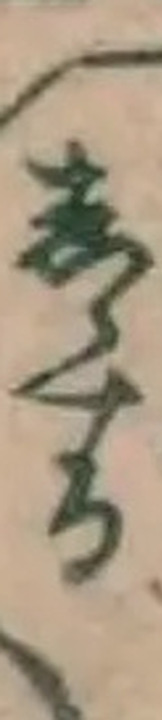しらする
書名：伊達錦對将 : 森田座
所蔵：国立国会図書館 National Diet Library, JAPAN
